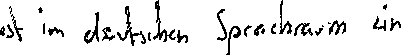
ist im deutschen Sprachraum ein
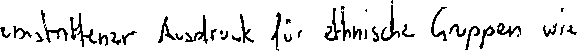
umstrittener Ausdruck für ethnische Gruppen wie
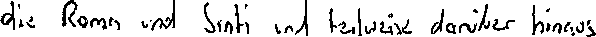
die Roma und Sinti und teilweise darüber hinaus
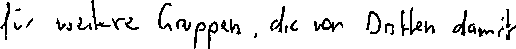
für weitere Gruppen, die von Dritten damit
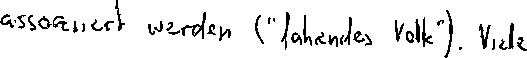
ssoziiert werden ("fahrendes Volk"). Viele
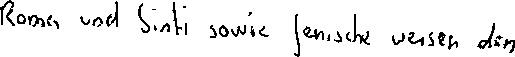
Roma und Sinti sowie Jenische weisen den
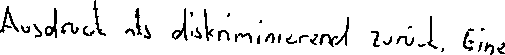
Ausdruck als diskriminierend zurück. Eine
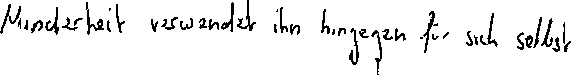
Minderheit verwendet ihn hingegen für sich selbst
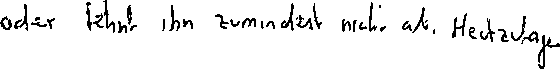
oder lehnt ihn zumindest nicht ab.Heutzutage
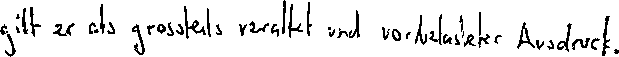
gilt er als großteils veraltet und vorbelasteter Ausdruck.
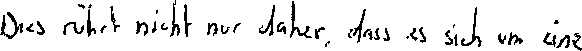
Dies rührt nicht nur daher, dass es sich um eine
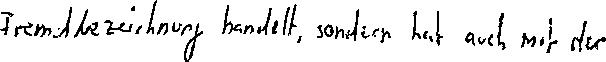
Fremdbezeichnung handelt, sondern hat auch mit der
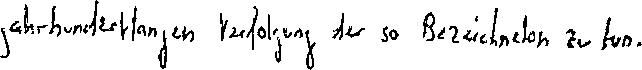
jahrhundertelangen Verfolgung der so Bezeichneten zu tun.
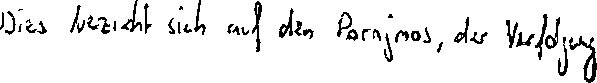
Dies bezieht sich auf den Porajmos, der Verfolgung
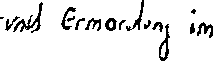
und Ermordung im
